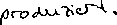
produziert.
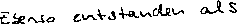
Ebenso entstanden als
